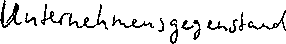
Unternehmensgegenstand
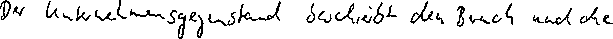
Der Unternehmensgegenstand beschreibt den Bereich und die
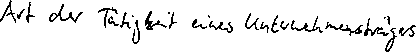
Art der Tätigkeit eines Unternehmensträgers.
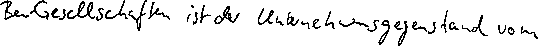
Bei Gesellschaften ist der Unternehmensgegenstand vom
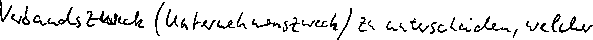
Verbandszweck (Unternehmenszweck) zu unterscheiden, welcher
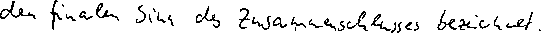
den finalen Sinn des Zusammenschlusses bezeichnet.
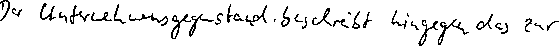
Der Unternehmensgegenstand beschreibt hingegen das zur
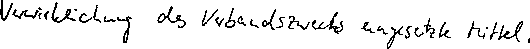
Verwirklichung des Verbandszwecks eingesetzte Mittel.
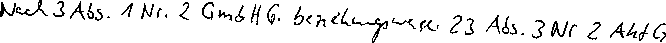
Nach 3 Abs. 1 Nr. 2 GmbHG beziehungsweise 23 Abs. 3 Nr. 2 AktG
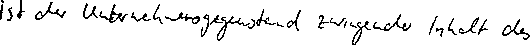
ist der Unternehmensgegenstand zwingender Inhalt des
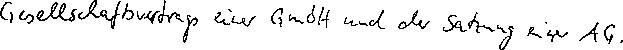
Gesellschaftsvertrags einer GmbH und der Satzung einer AG.
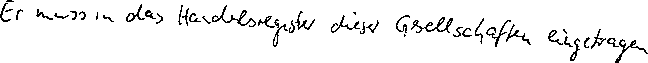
Er muss in das Handelsregister dieser Gesellschaften eingetragen
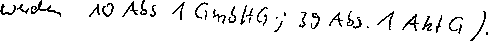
werden 10 Abs. 1 GmbHG; 39 Abs. 1 AktG).
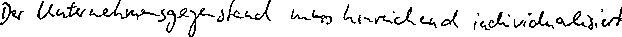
Der Unternehmensgegenstand muss hinreichend individualisiert
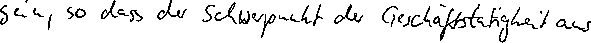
ein, so dass der Schwerpunkt der Geschäftstätigkeit aus
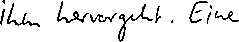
ihm hervorgeht. Eine
